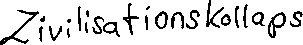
Zivilisationskollaps
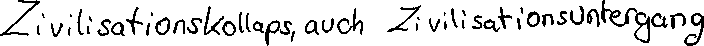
Zivilisationskollaps, auch Zivilisationsuntergang
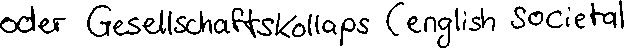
oder Gesellschaftskollaps (englisch societal
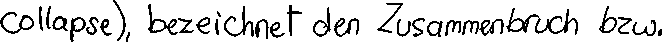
collapse), bezeichnet den Zusammenbruch bzw.
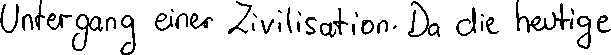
Untergang einer Zivilisation. Da die heutige
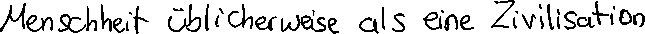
Menschheit üblicherweise als eine Zivilisation
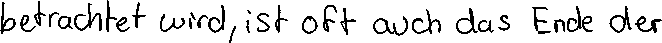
betrachtet wird, ist oft auch das Ende der
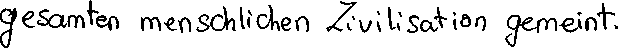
gesamten menschlichen Zivilisation gemeint.
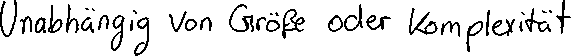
Unabhängig von Größe oder Komplexität
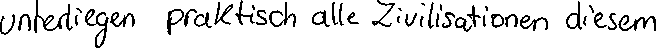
unterliegen praktisch alle Zivilisationen diesem
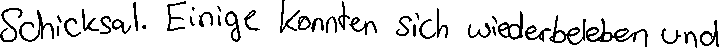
Schicksal. Einige konnten sich wiederbeleben und
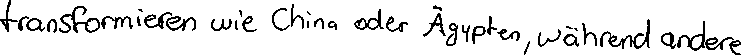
transformieren wie China oder Ägypten, während andere
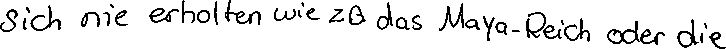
sich nie erholten wie z.B. das Maya-Reich oder die
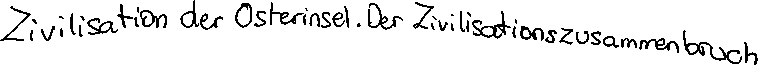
Zivilisation der Osterinsel. Der Zivilisationszusammenbruch
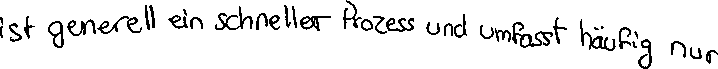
ist generell ein schneller Prozess und umfasst häufig nur
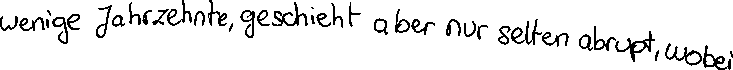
wenige Jahrzehnte, geschieht aber nur selten abrupt, wobei
